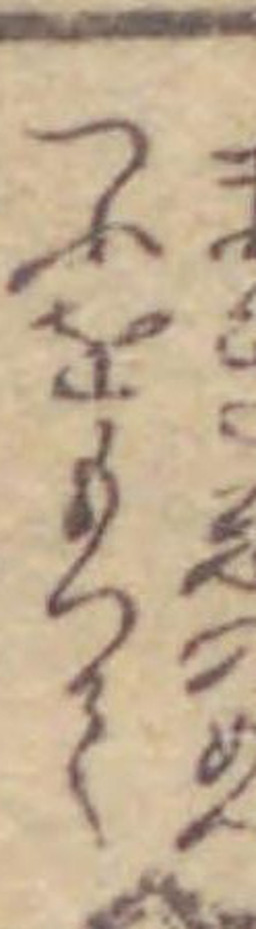つふをもつて
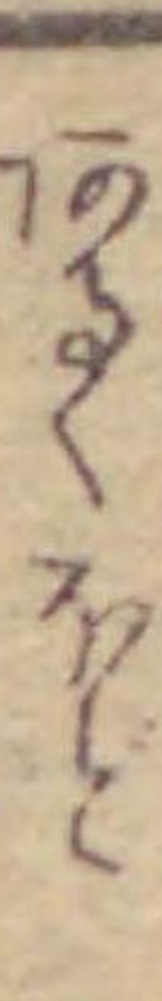あるくほど
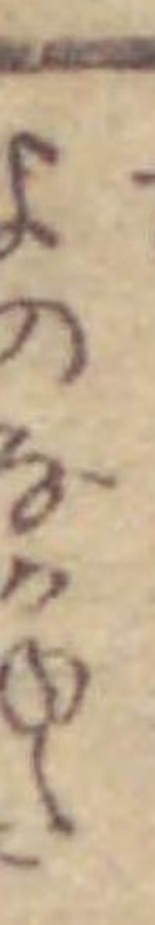よのなかゆた
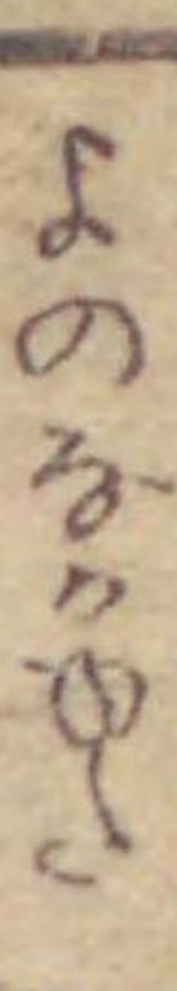よのなかゆた
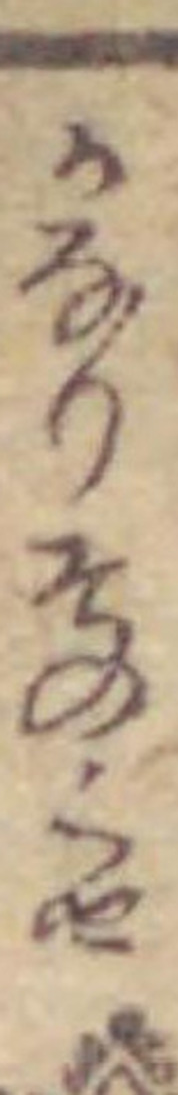かなりそのくせ
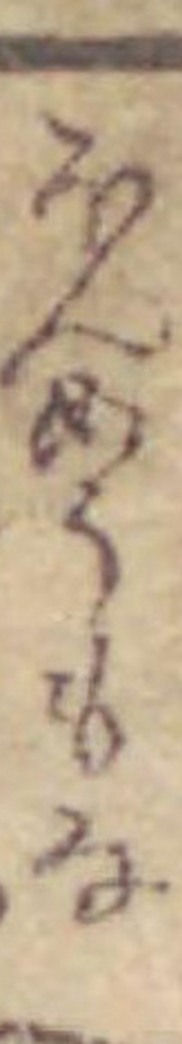ほんめうもな
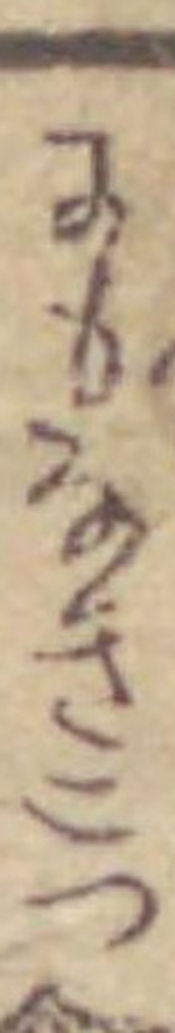にもなきこつ
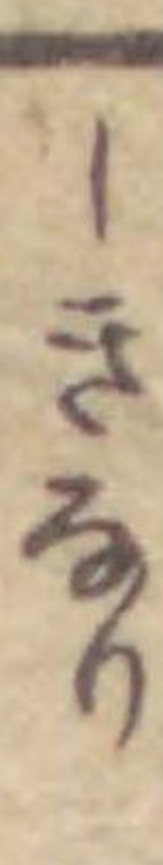しきなり
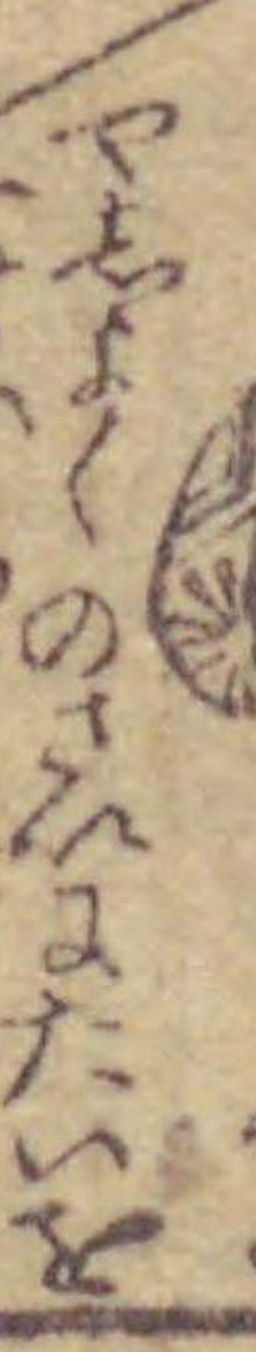やしよくのさいにたいを
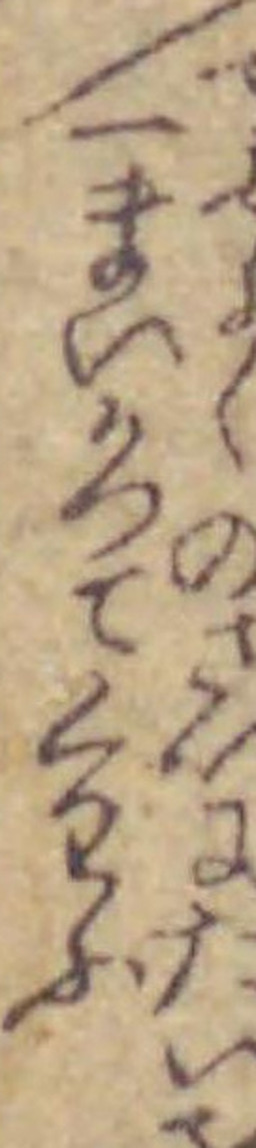一まいかつてくわふ
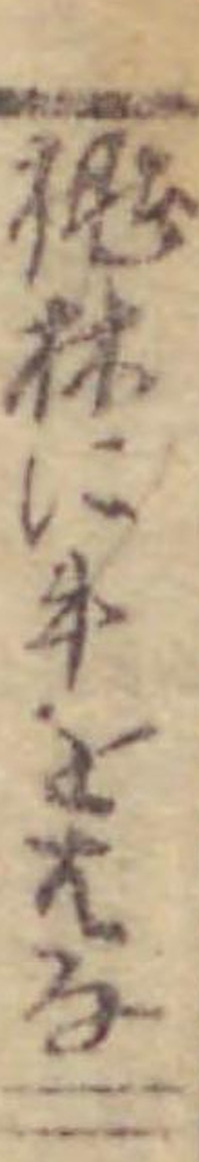桃林に牛をはな
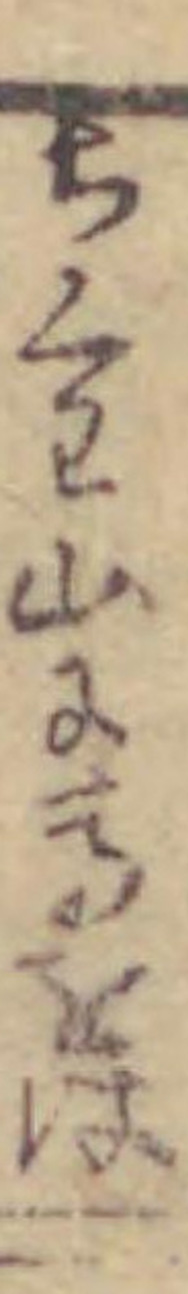ちくわ山に馬をは
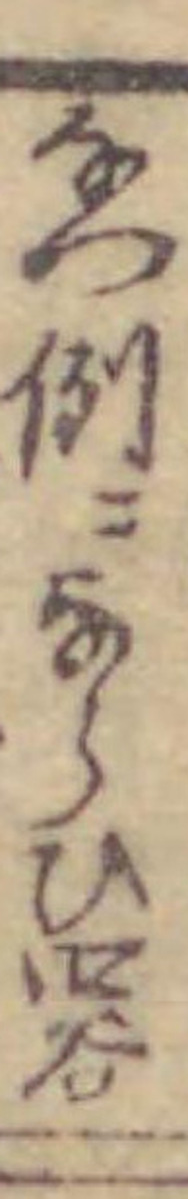なつ例にならひ四谷
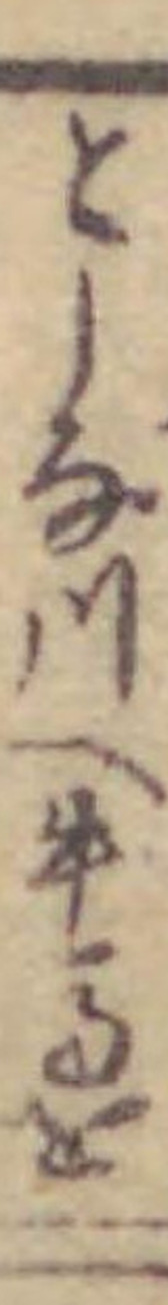としな川へ牛馬を
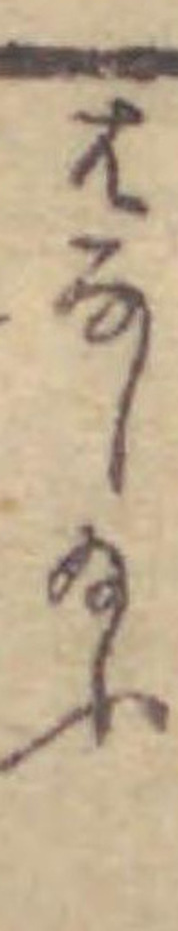はなし給ふ
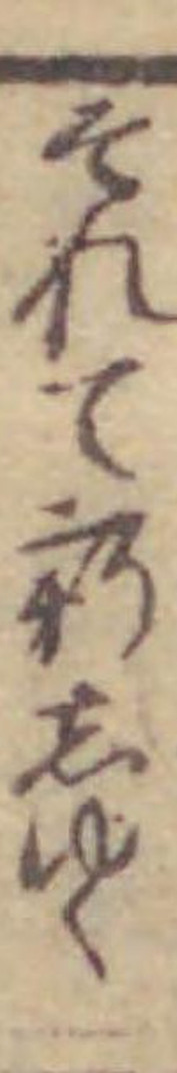それて新しゆく
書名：天下一面鏡梅鉢 : 3巻
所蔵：国立国会図書館 National Diet Library, JAPAN
